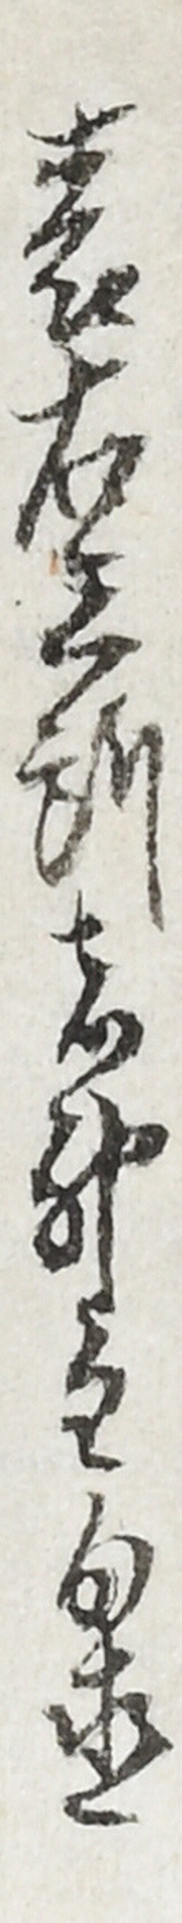表右三所は神主より直
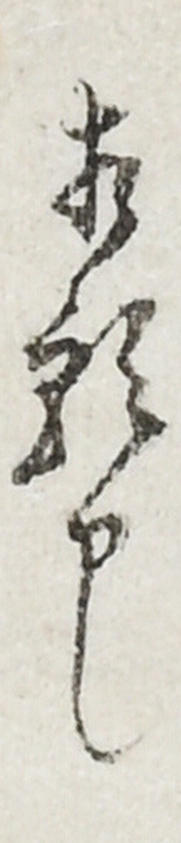相願申候
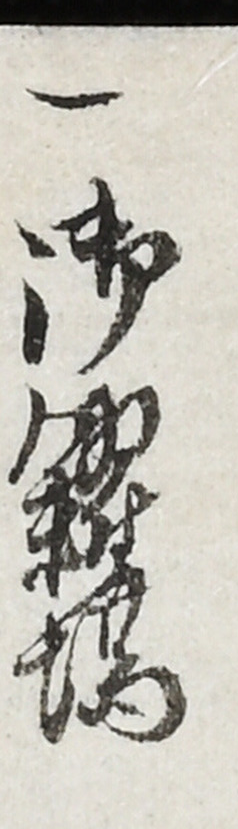一御鍬場
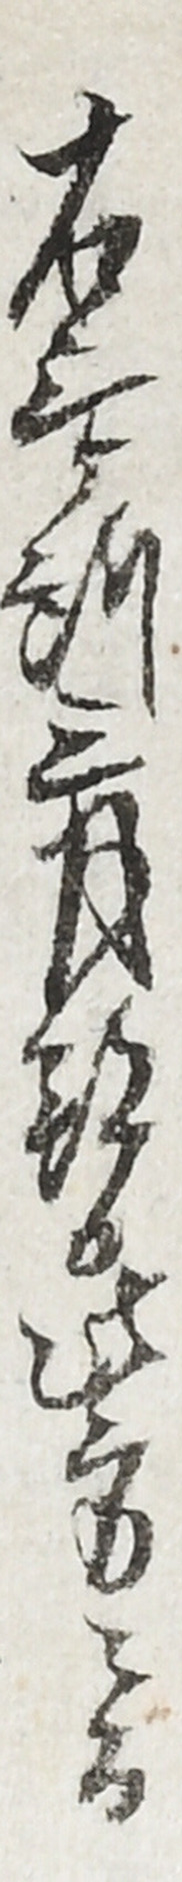右三ヶ所三月朔日此方ニ而
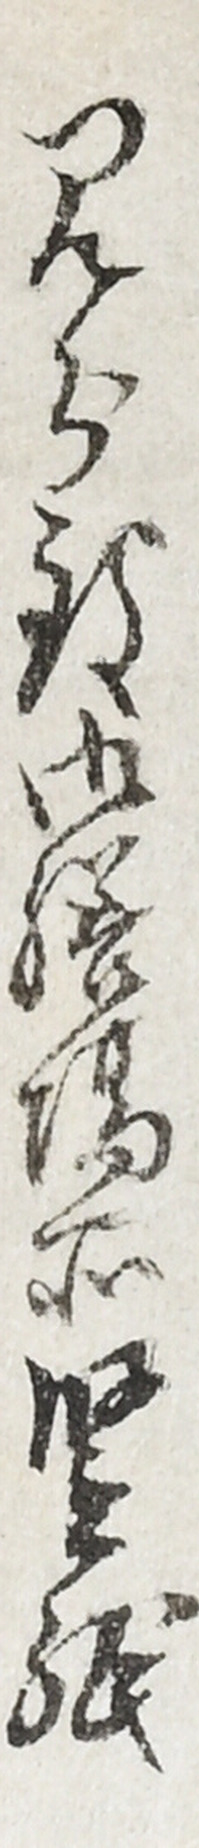見分致御繕場所堅紙
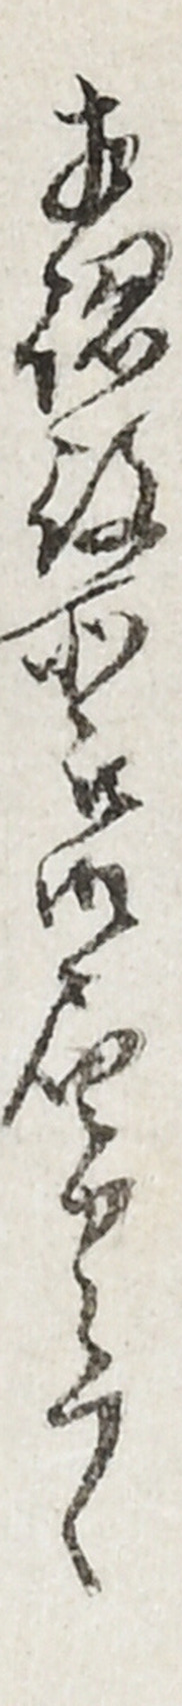相認役所江御届申候はゝ
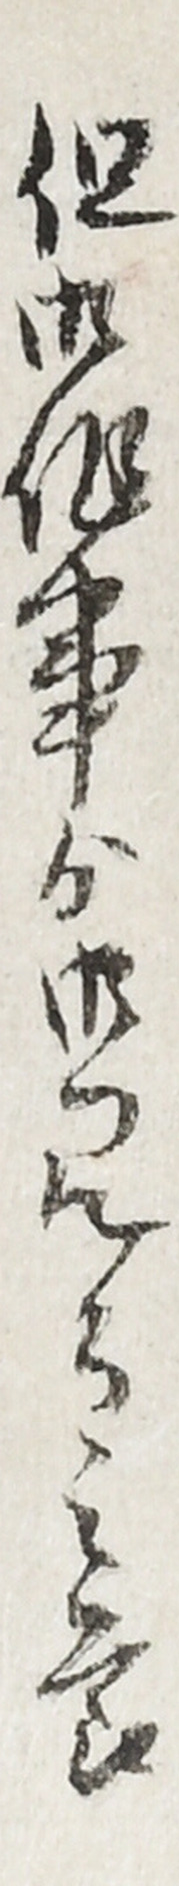但御作事より御見分之節
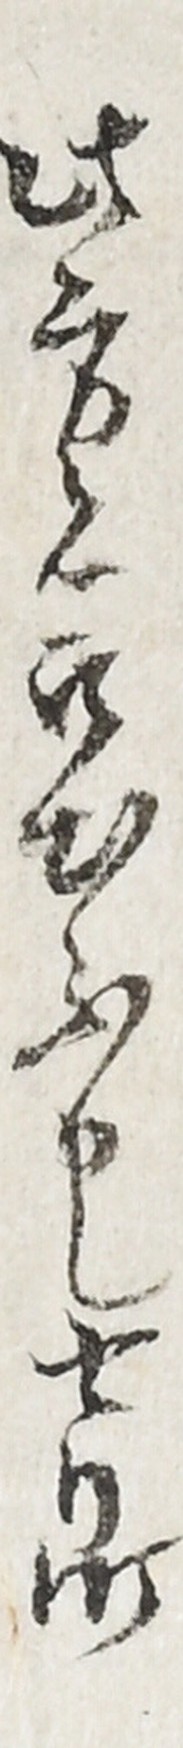此方は被出不申七月町
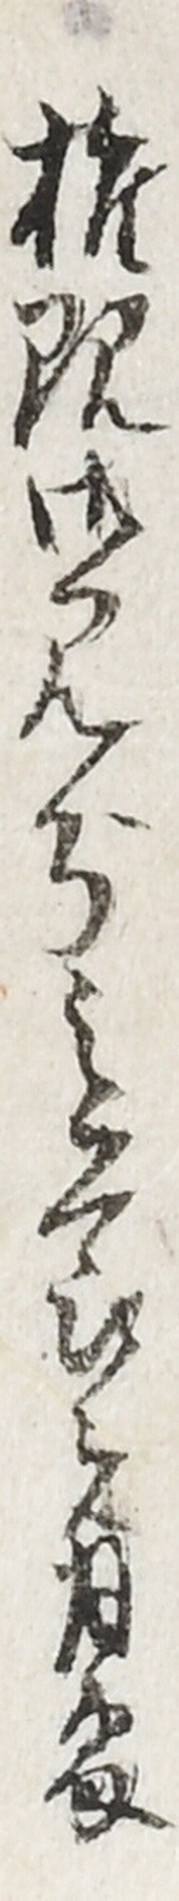権現御見分之節は月番
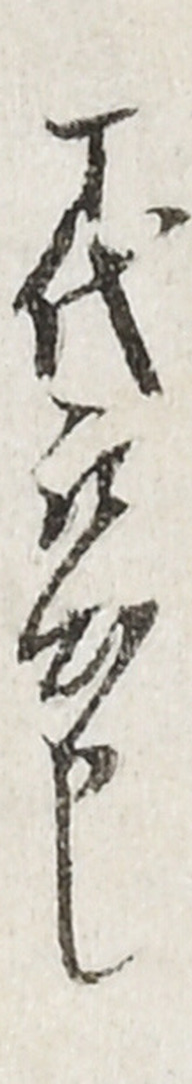丁代罷出申候
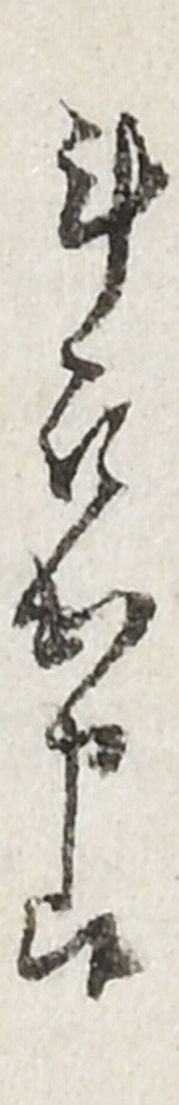計罷出申候
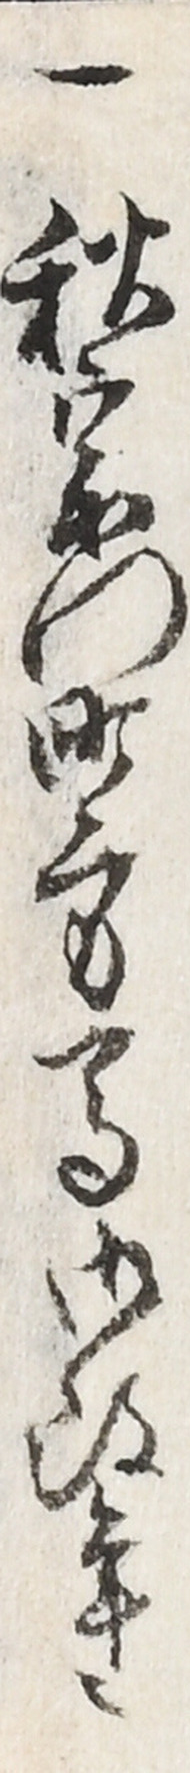一秋宗門町方馬御改年之
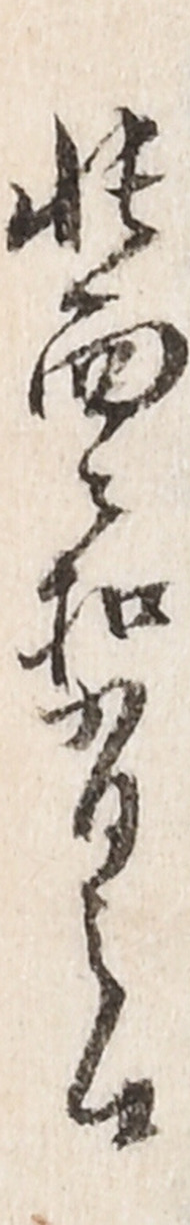帳面を扣有之候
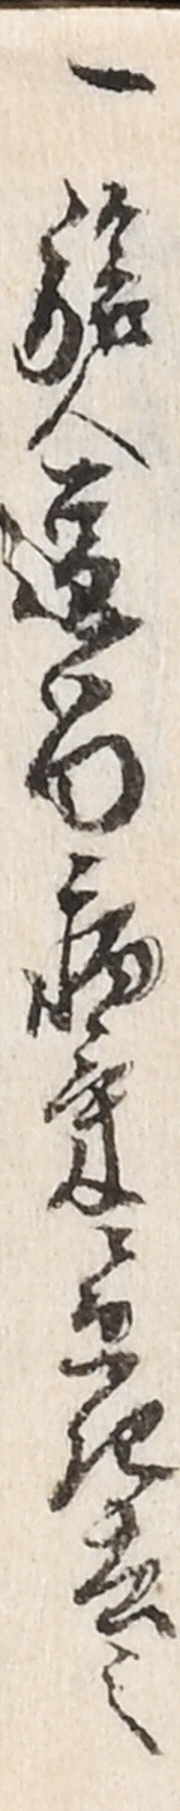旅人逗留病気ニ而罷去之
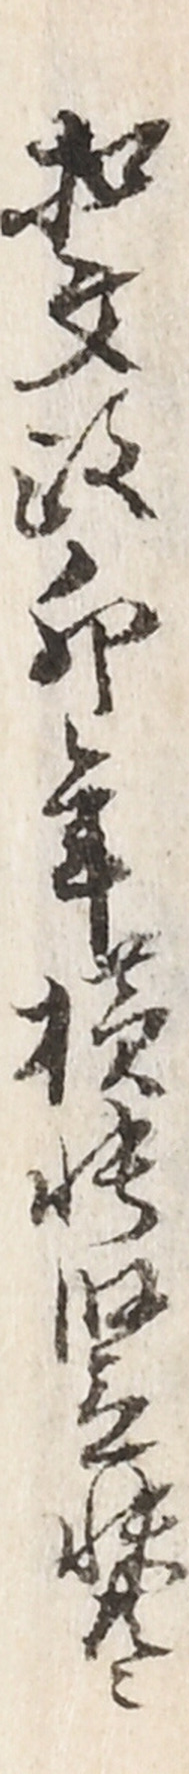扣文政卯年横帳竪状共々
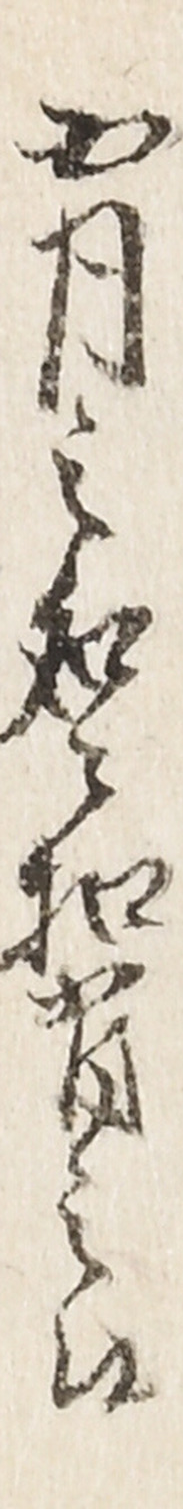五月之処を扣有之候
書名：年内行事懐中録
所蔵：伊那市立高遠町図書館・合同会社AMANE
